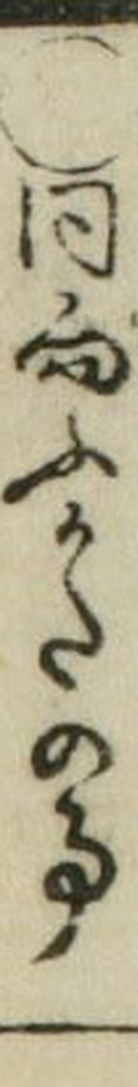○同向ふかたの事
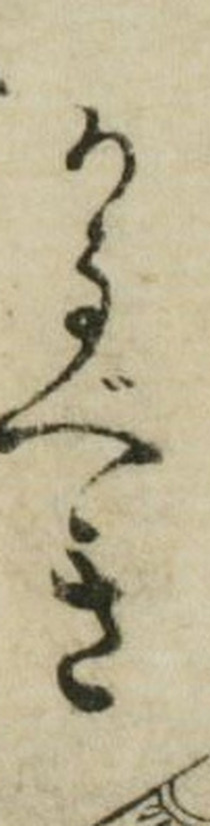かるべき
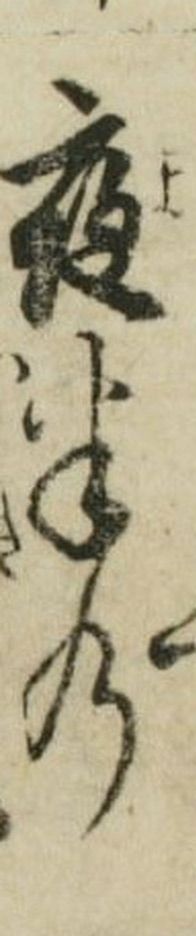夜半の
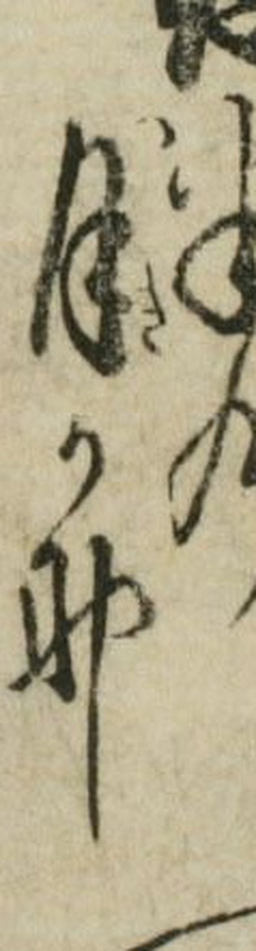月かな
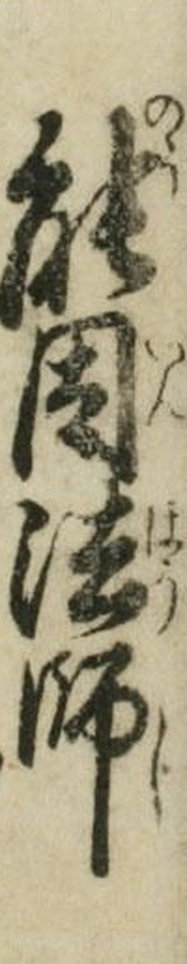能因法師
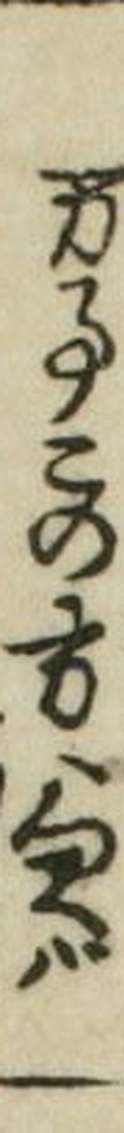万事この方へ向へば
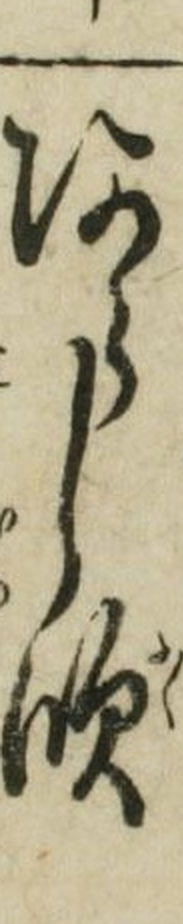あらし吹
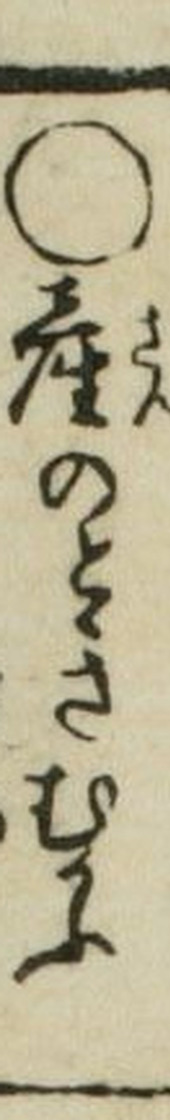○産のときむかふ
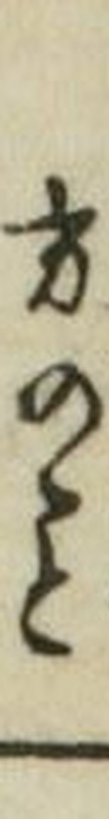方のこと
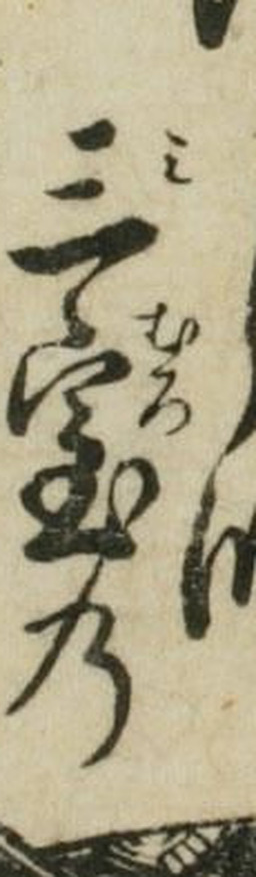三室の
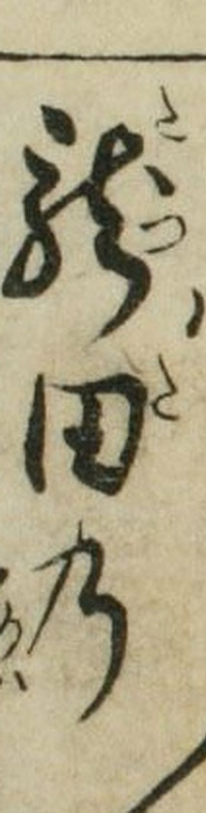竜田の
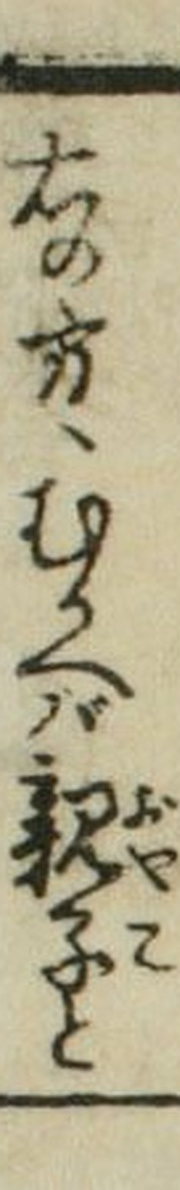右の方へむかへば親子と
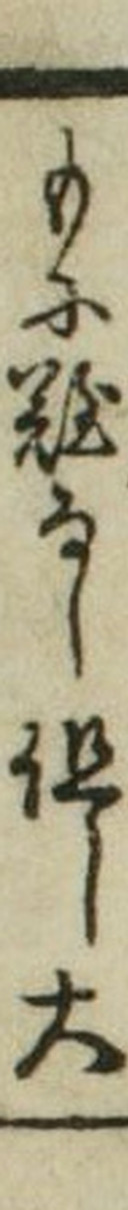もに難なし但し大
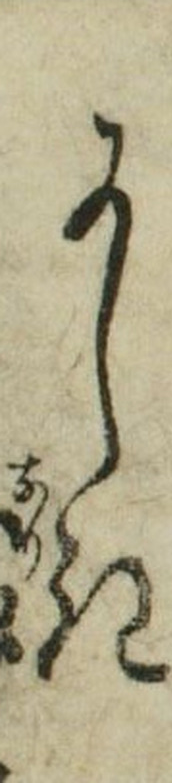にしき
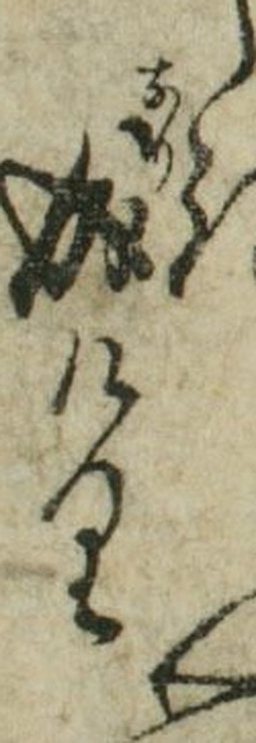成けり

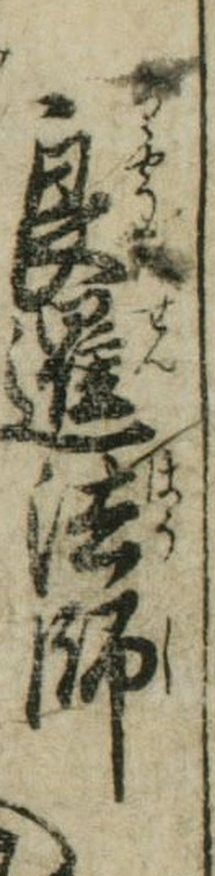良暹法師
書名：百人一首
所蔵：東京学芸大学教育コンテンツアーカイブ
